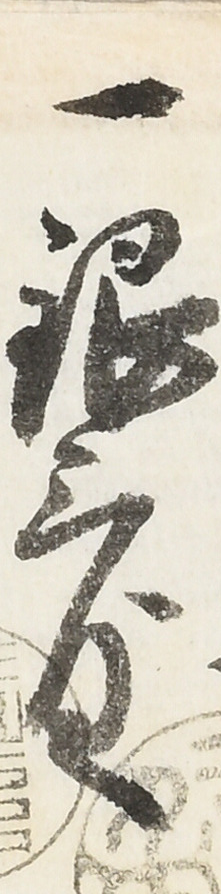一銀三匁
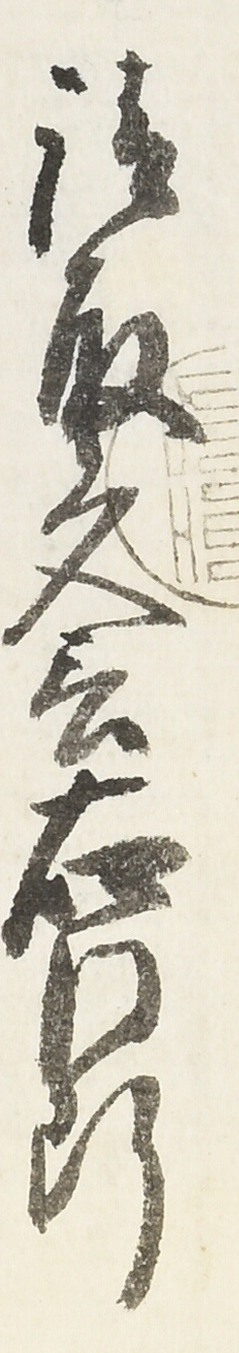請取文言右同断
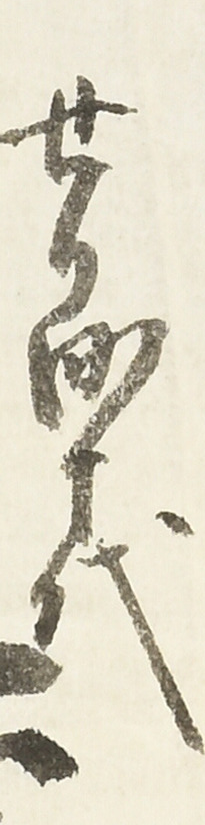せり町丁代
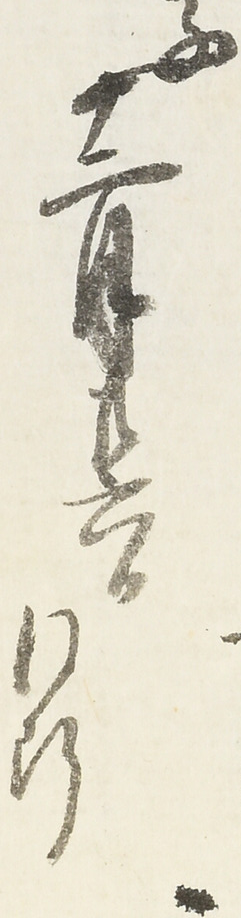十二月廿六日同断
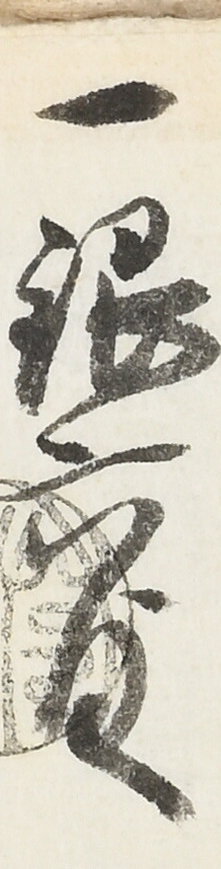一銀三匁
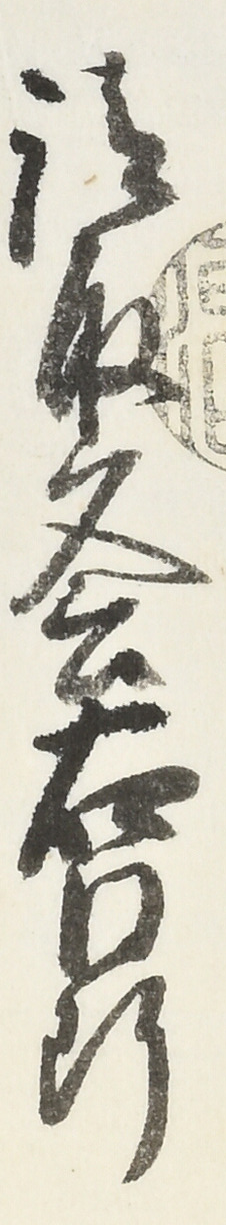請取文言右同断
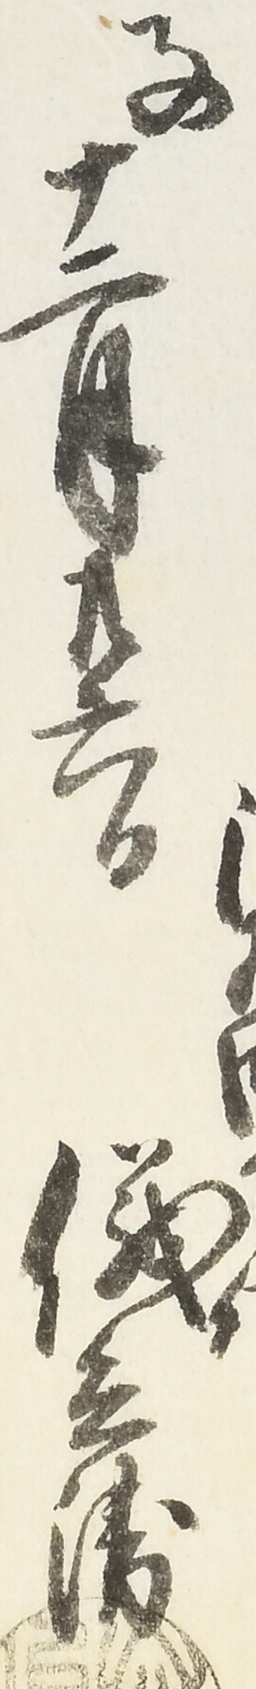十二月廿六日儀兵衛
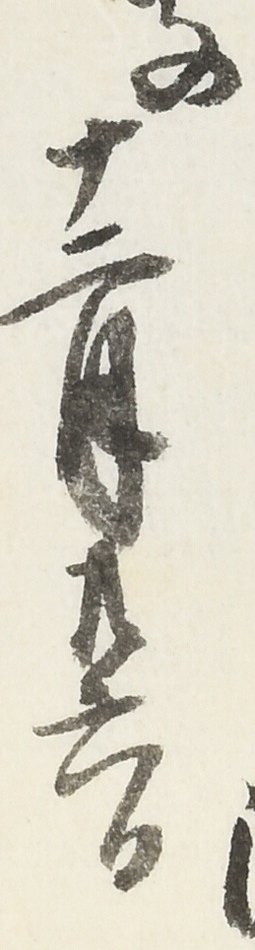十二月廿六日同断

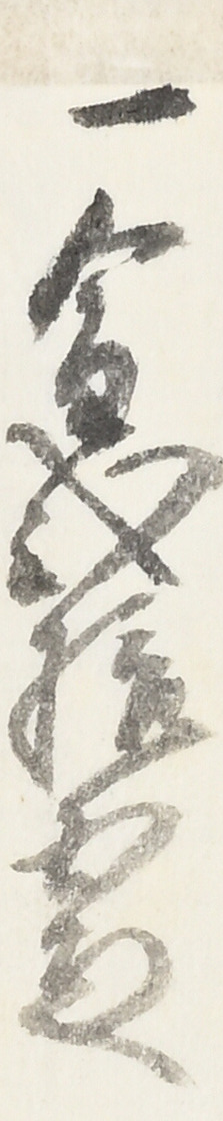一金弐拾五両
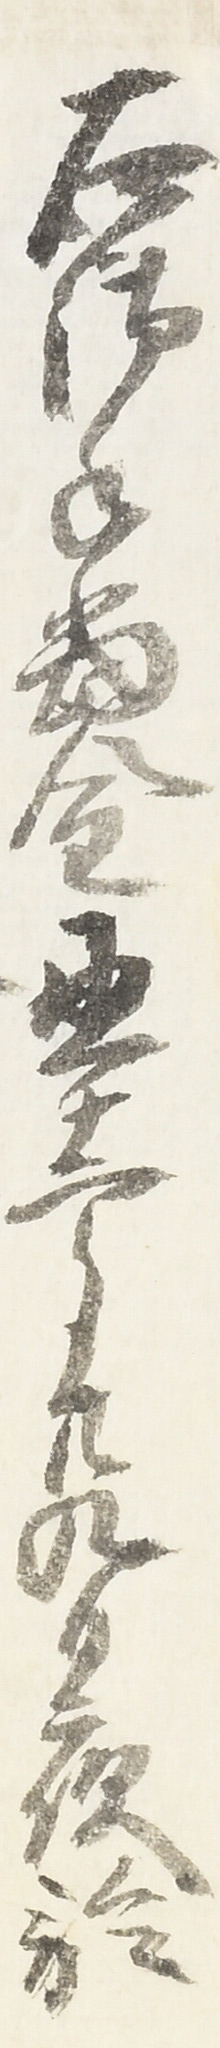右御手当金丑十二月廿九日夜於
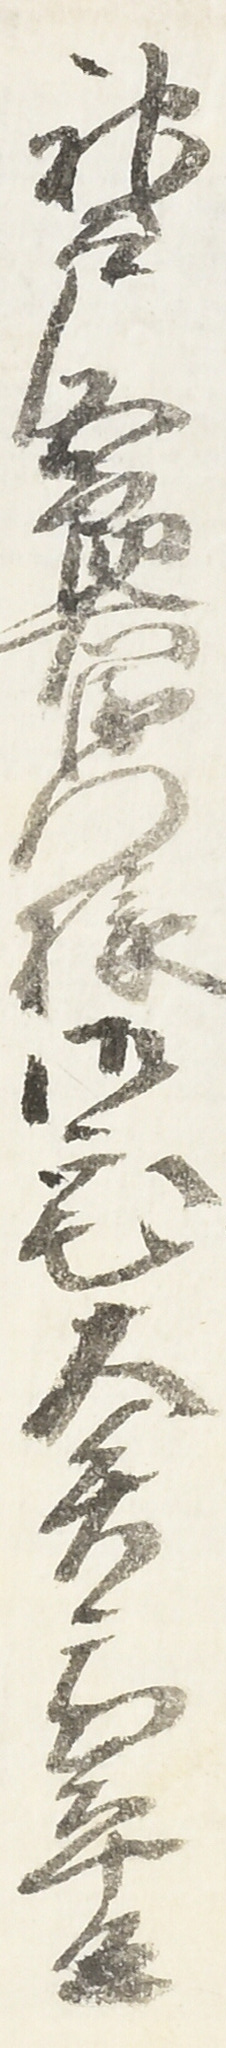神戸五郎右衛門様御宅大矢甚平殿
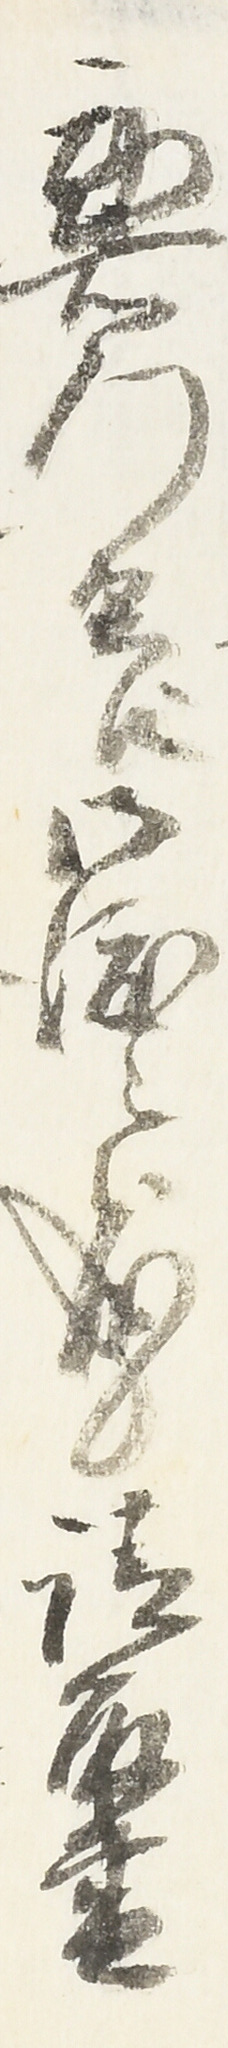惣右衛門殿江御渡し被成候請取書
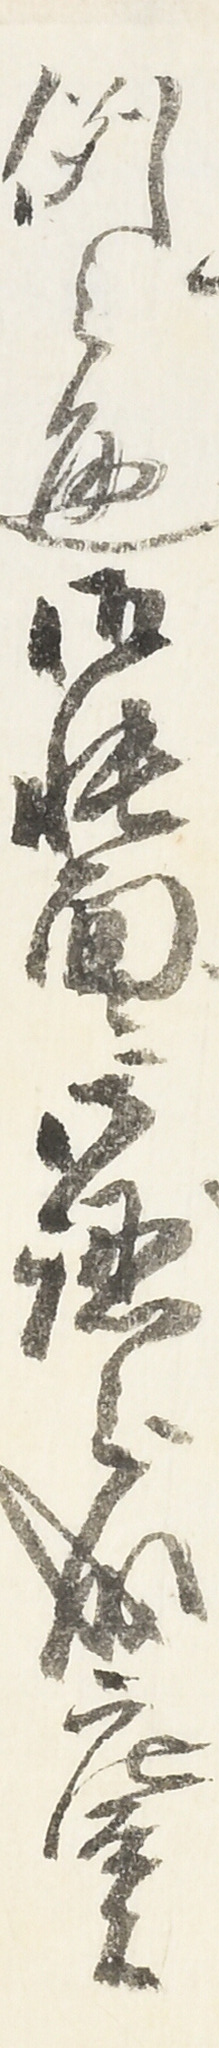例之通御帳面ニ御認被成庄左衛門
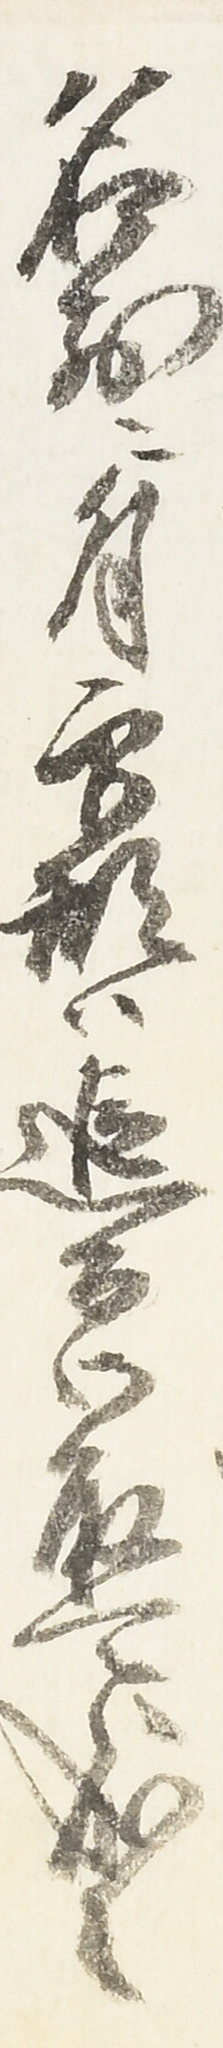名前ニ付印形ハ追而御取可被成候
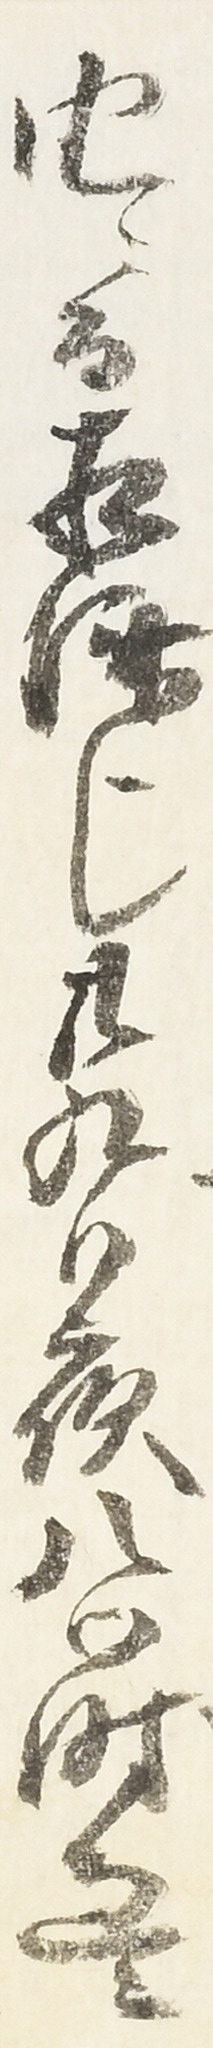由ニ而相済申候廿九日夜八ツ時過ニ
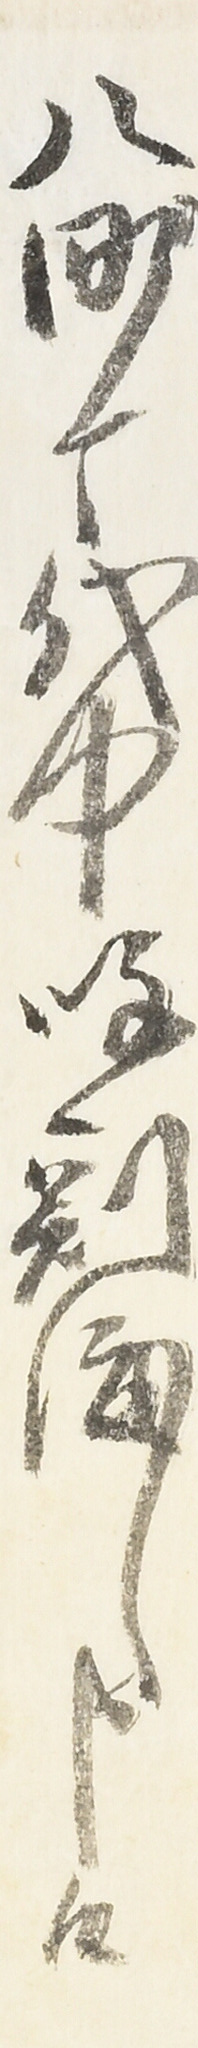八町丁代中呼割渡し申候
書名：御才覚金御利足割渡扣帳
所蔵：伊那市立高遠町図書館・合同会社AMANE
